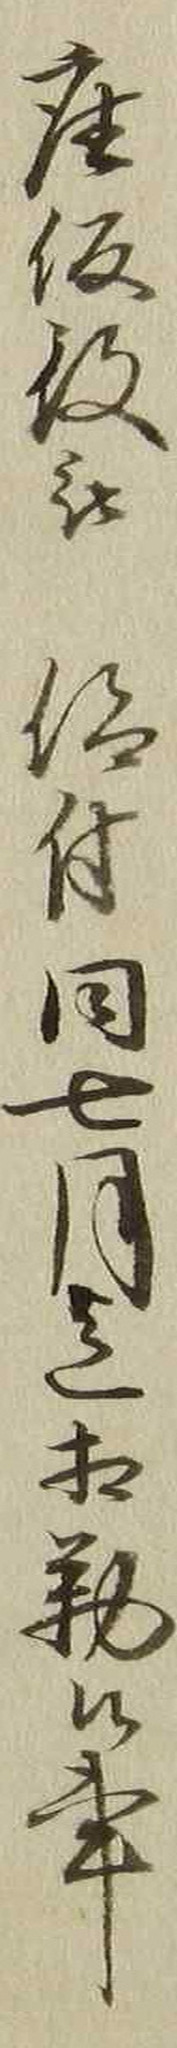座仮役被仰付同七月迄相勤候事
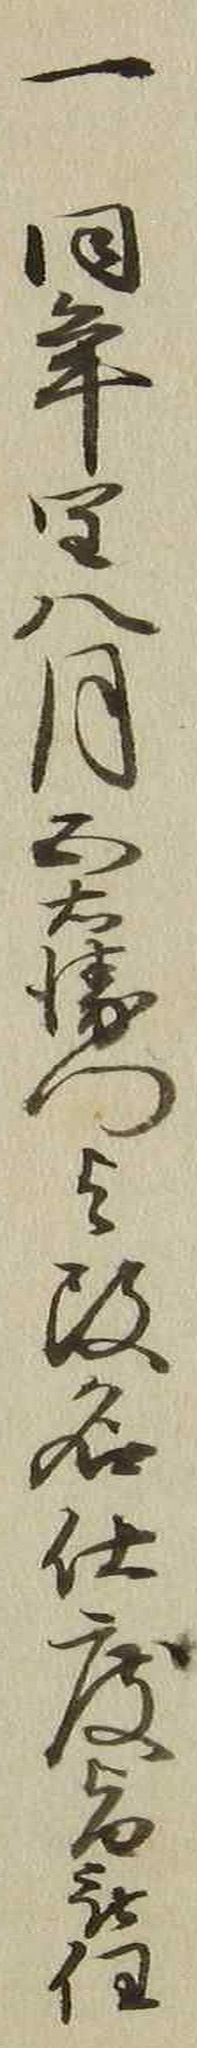一同年閏八月五右衛門と改名仕度旨被伺
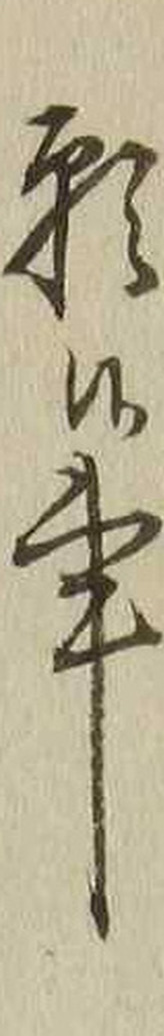願候事
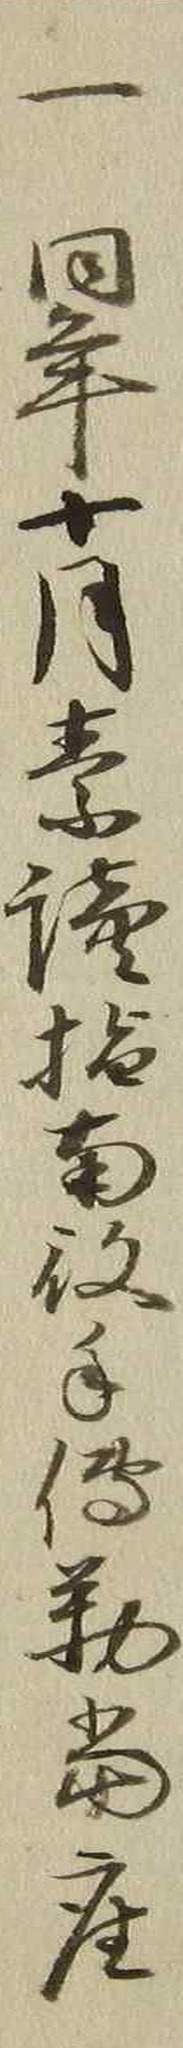一同年十月素読指南役手伝勤当座
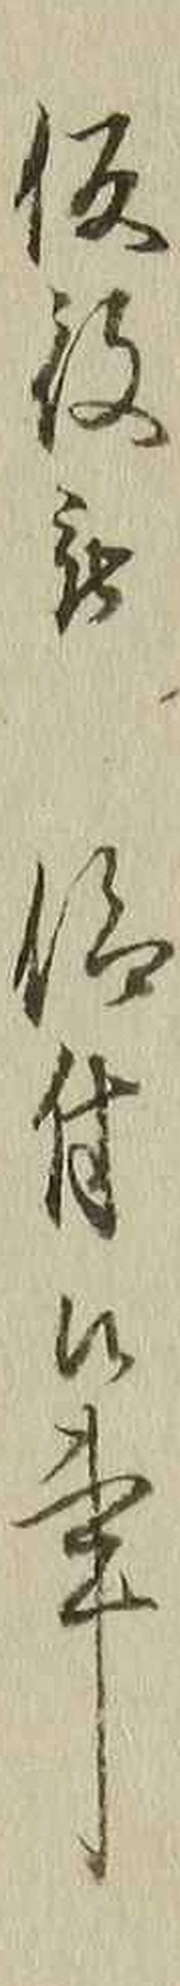仮役被仰付候事
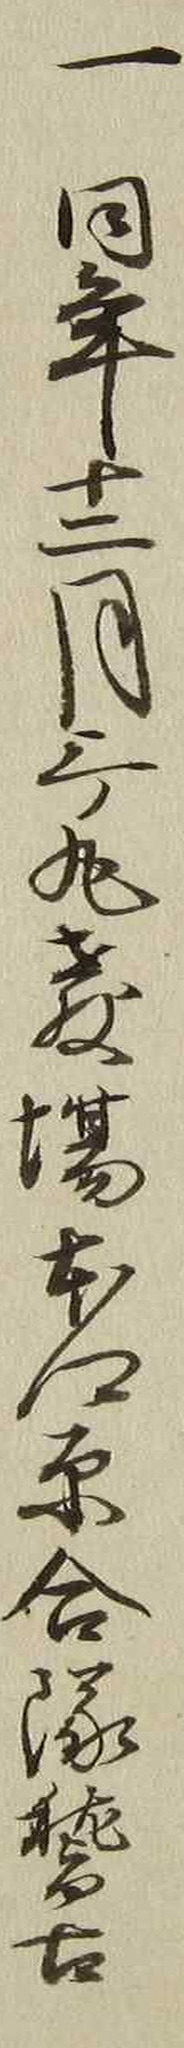一同年十二月三ノ丸教場本郷原合隊稽古
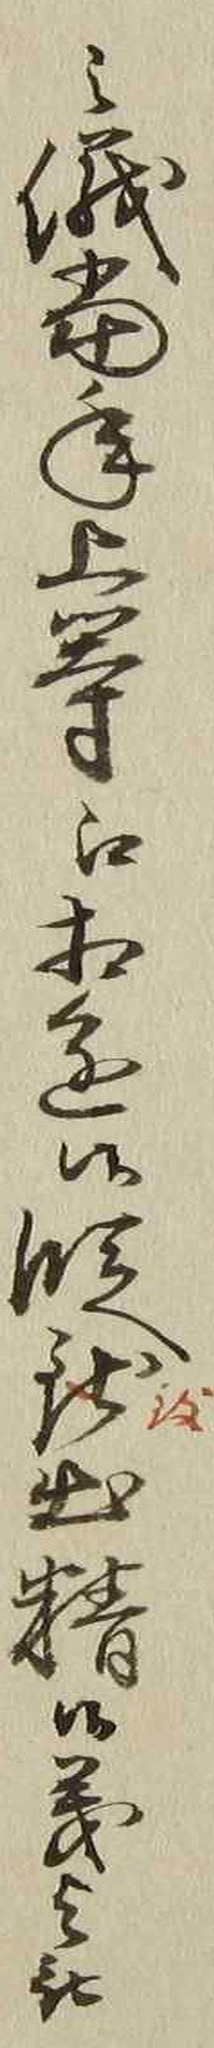之儀当年上等江相進候段致出精候義と被
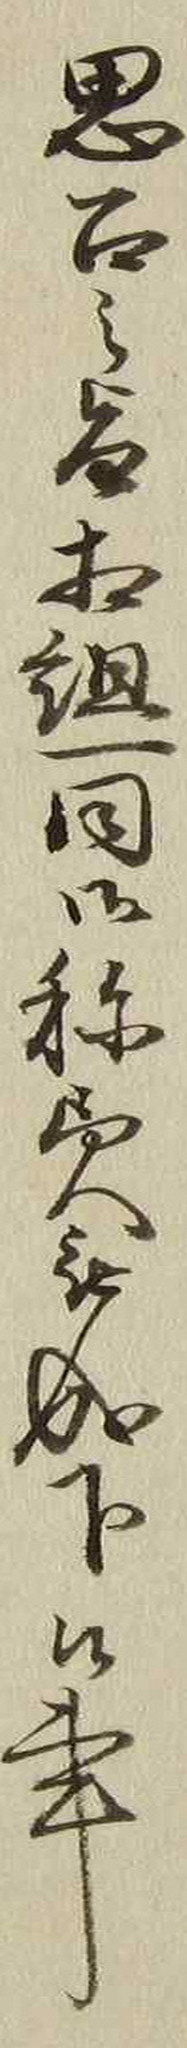思召之旨相組一同御称美被成下候事
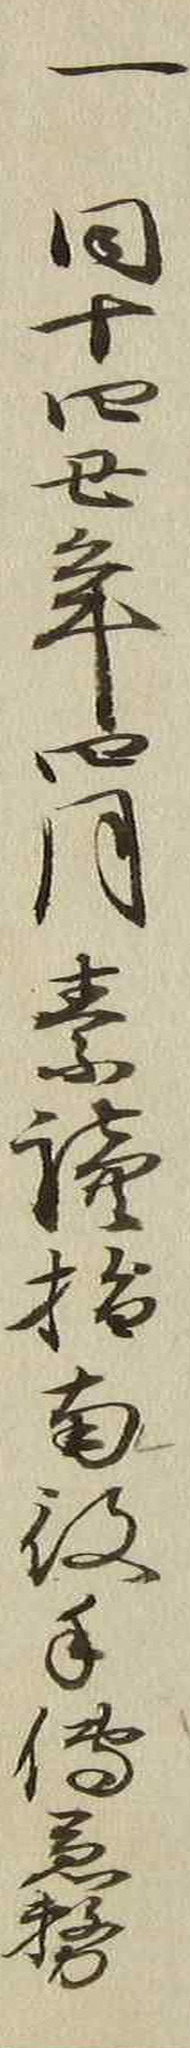一同十四丑年四月素読指南役手伝兼務
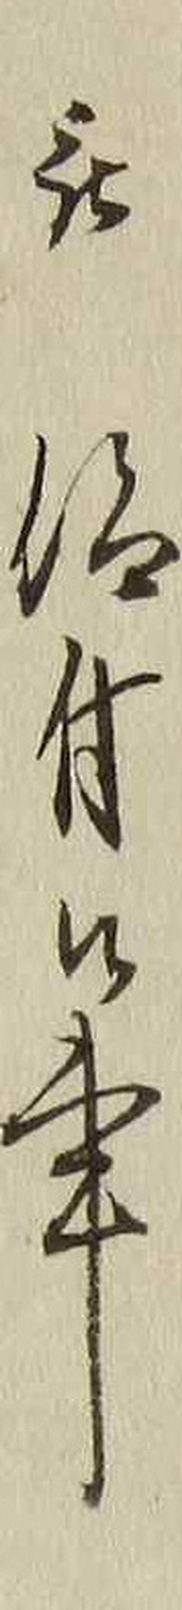被仰付候事
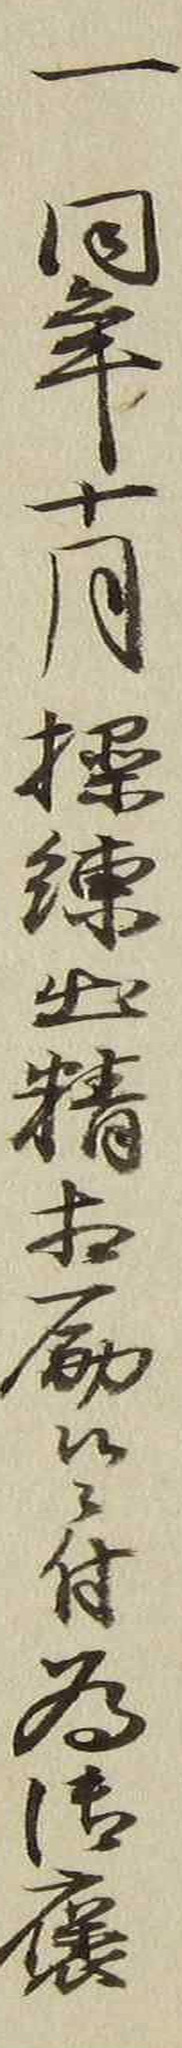一同年十月操練出精相励候ニ付為御褒
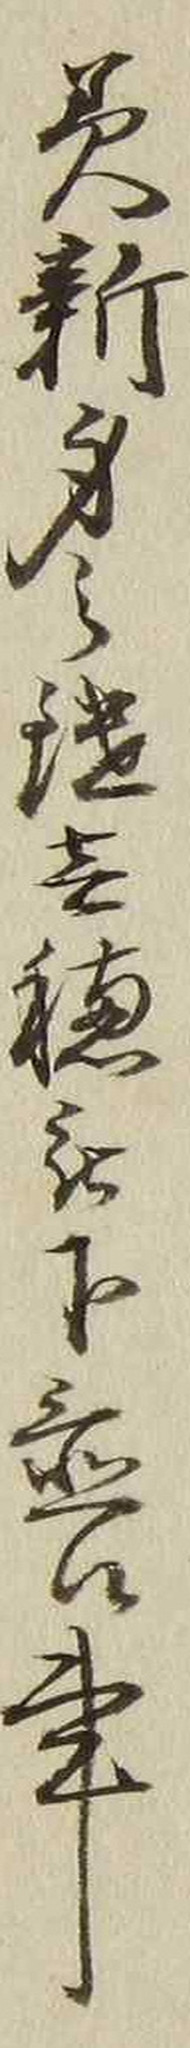美新身之鑓壱穂被下置候事
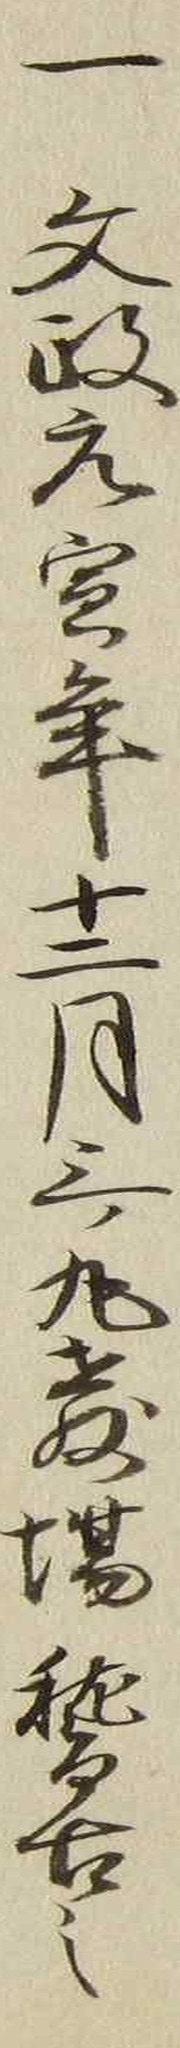一文政元寅年十二月三ノ丸教場稽古之
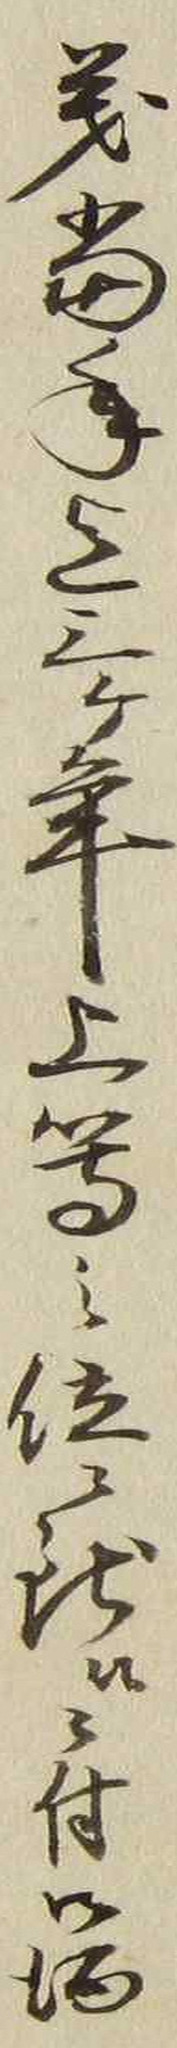義当年迄三ヶ年上等之位二致候ニ付御酒
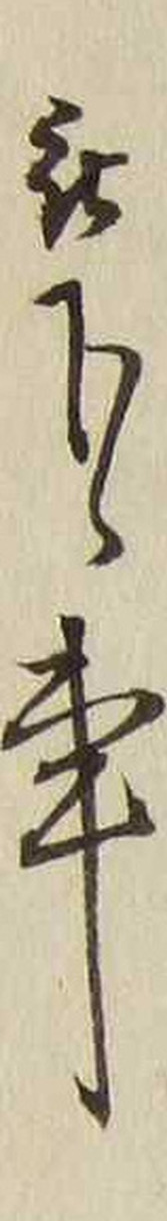被下候事

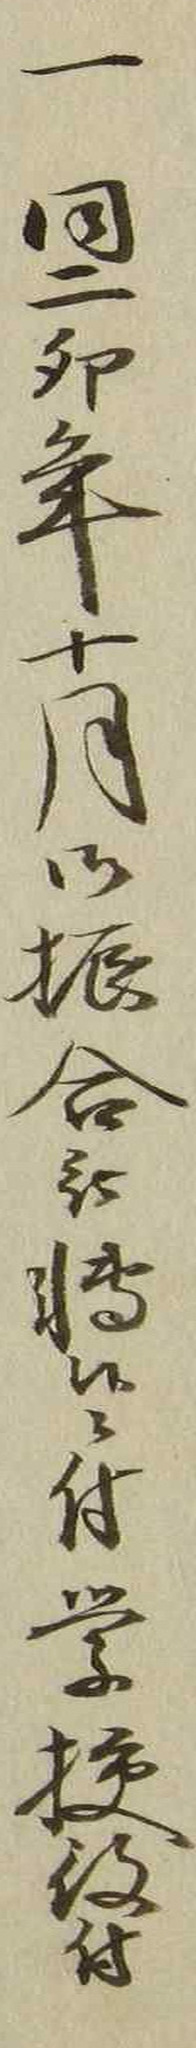一同ニ夘年十月御振合被転候ニ付学校役付
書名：諸士系譜　巻之114　か之部22
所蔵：会津若松市立会津図書館
